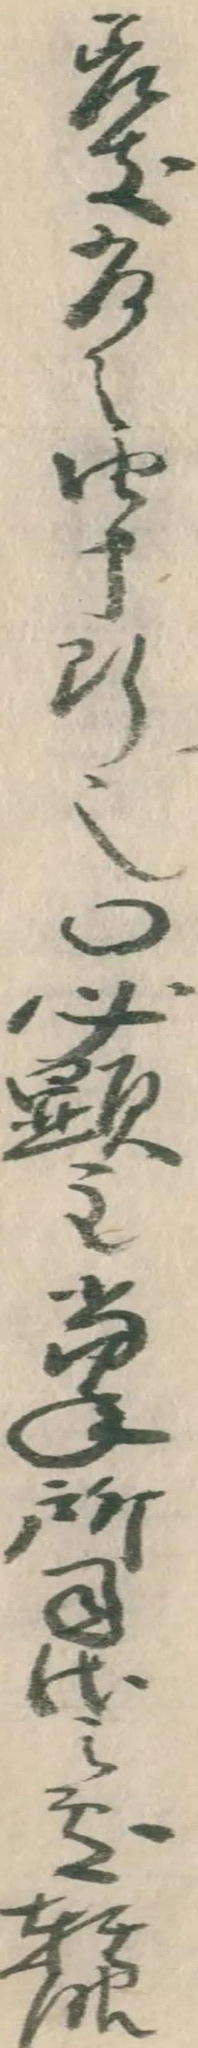差支有之由申断也○必顕主當年所司代之處軽服
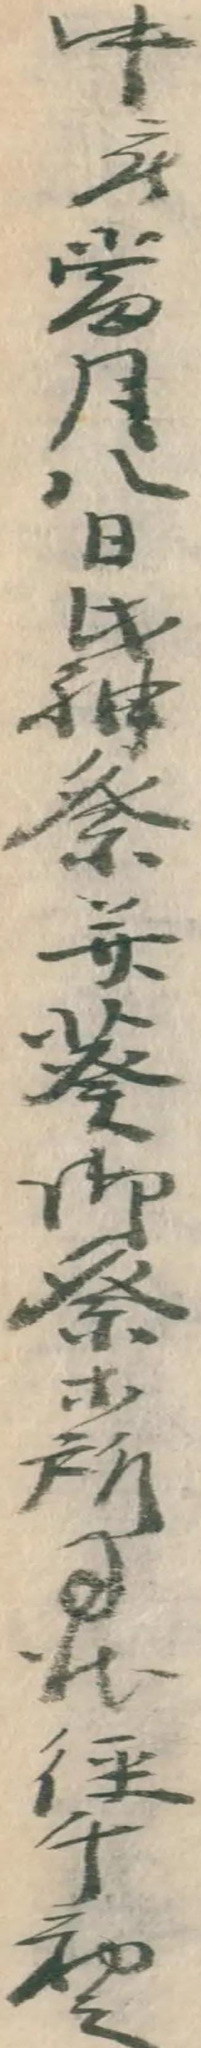中ニ付當月八日氏神祭并葵御祭等所司代経千勤之

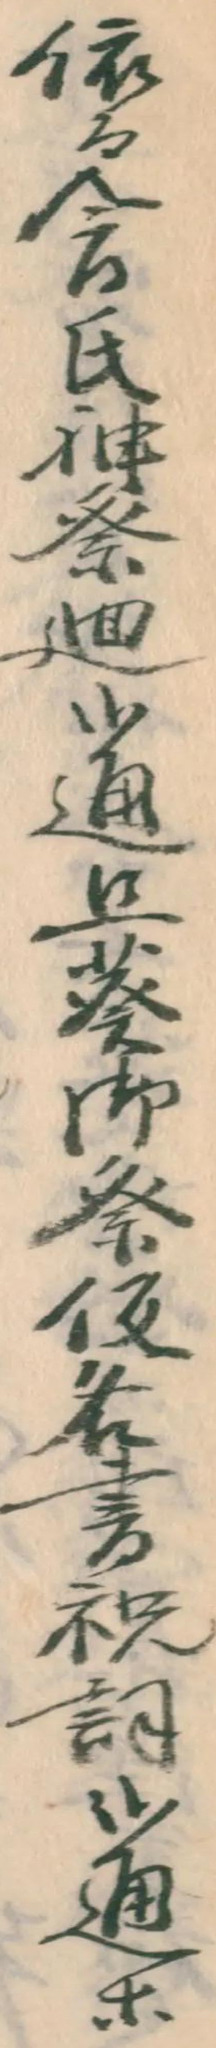依而今日氏神祭廻御通且葵御祭仮名書祝詞弐通等
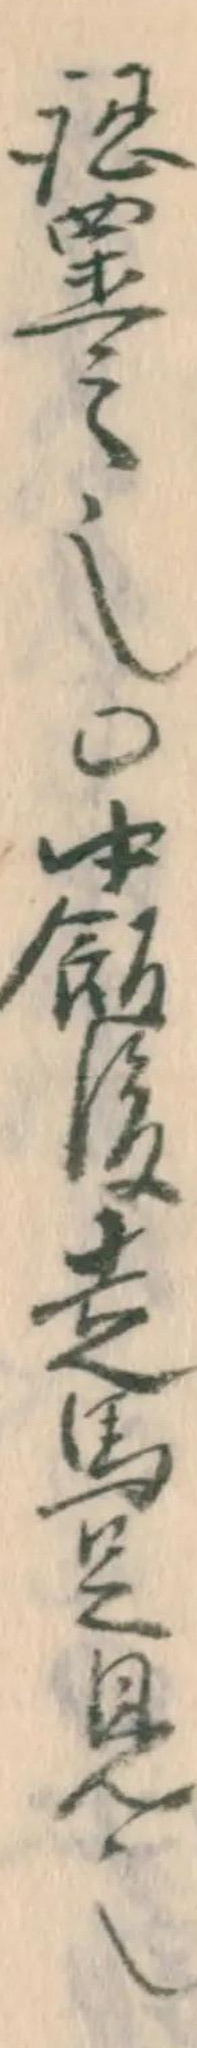認置也〇中飯後走馬足見也
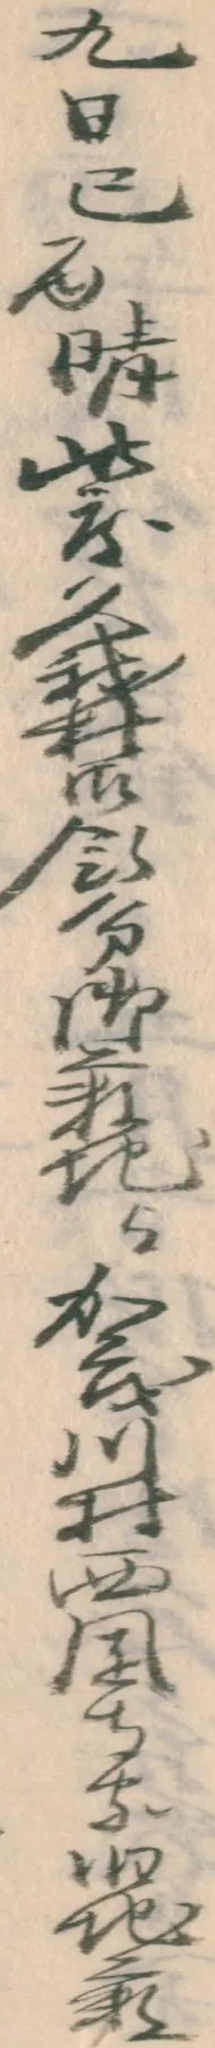九日己酉晴此度久我村御領分御藪地と加茂川村西国寺家旧地藪
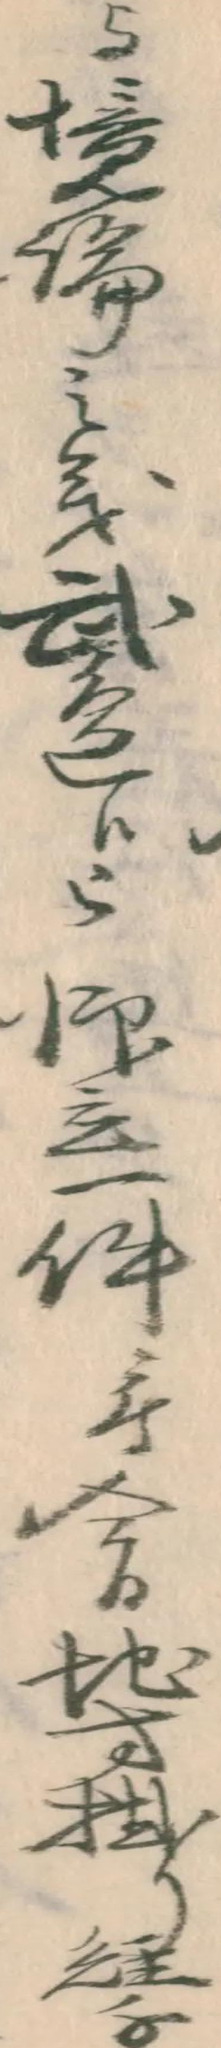と境論之義武邊え被仰立一件ニ付今日地方掛り経千
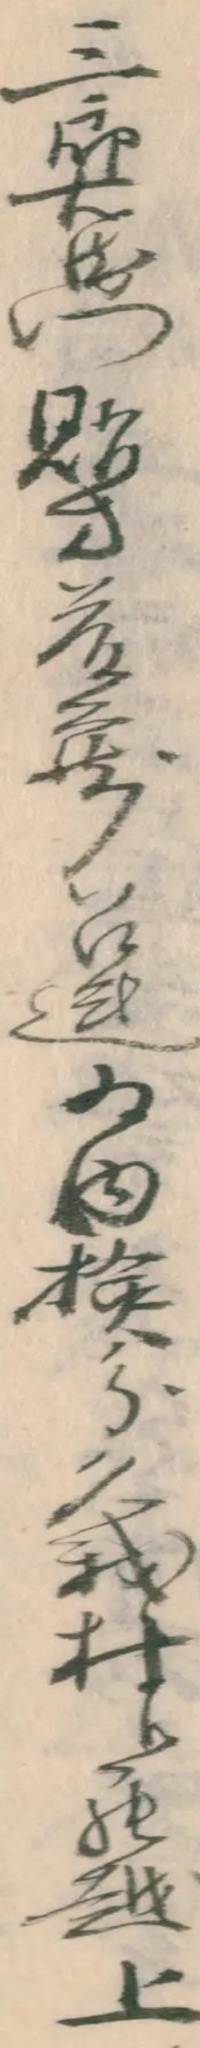三郎右衛門賄方藤蔵召連為内検分久我村え罷越上
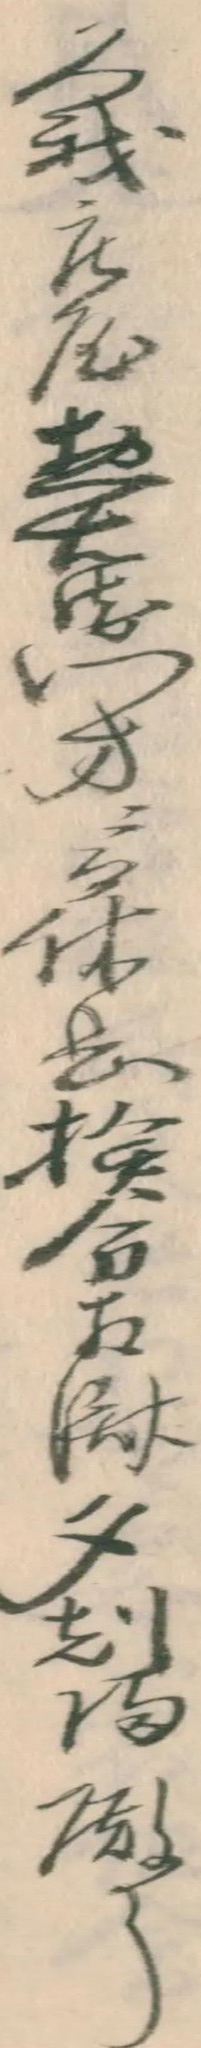久我庄屋惣右衛門方ニ而休息検分相済夕刻帰殿了
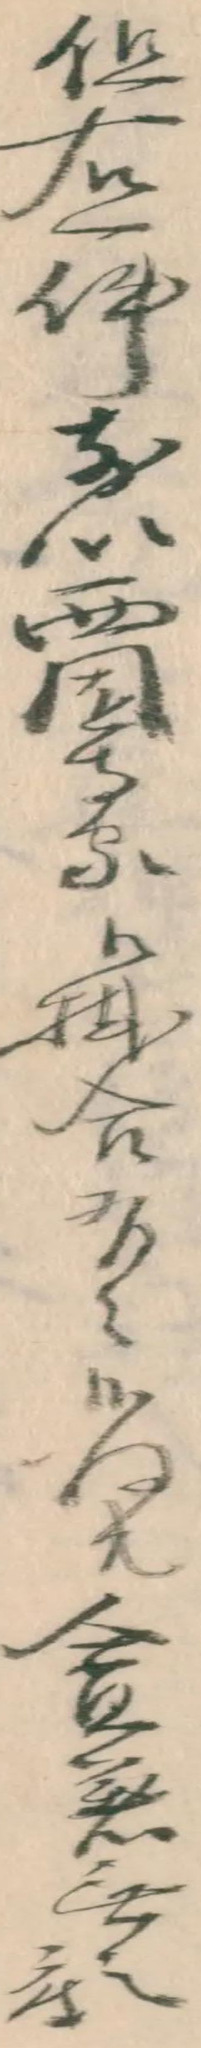但右一件前以西国寺家え掛合有之候得共今日着無之ニ付
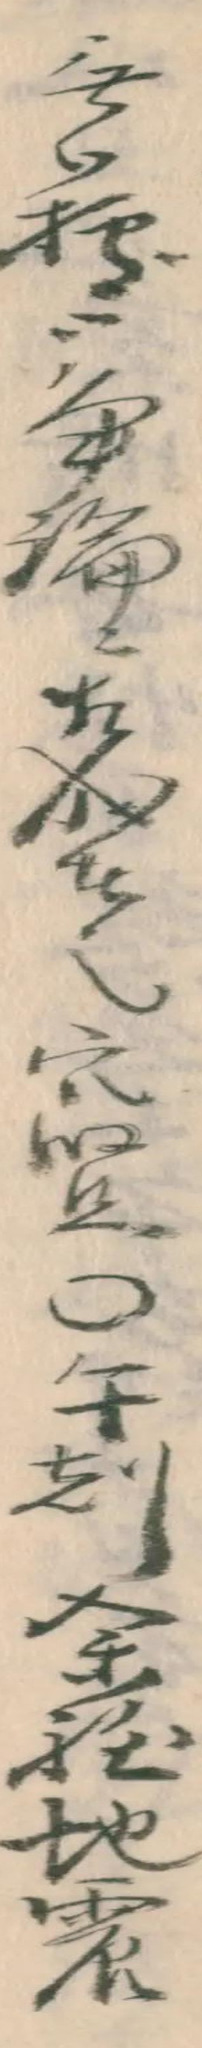無御拠御争論ニ相成在之穴覧○午刻余程地震
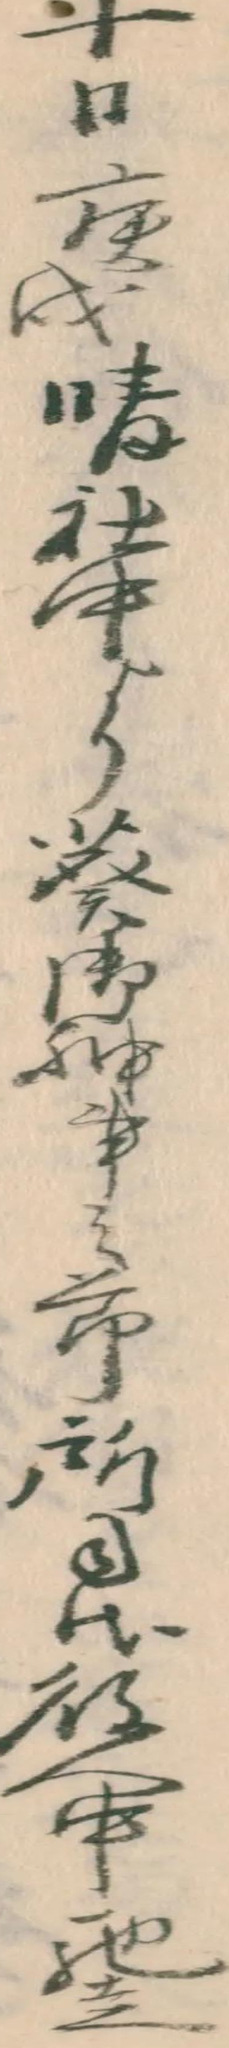十日庚戌晴社中より葵御神事之節所司代役人中馳走
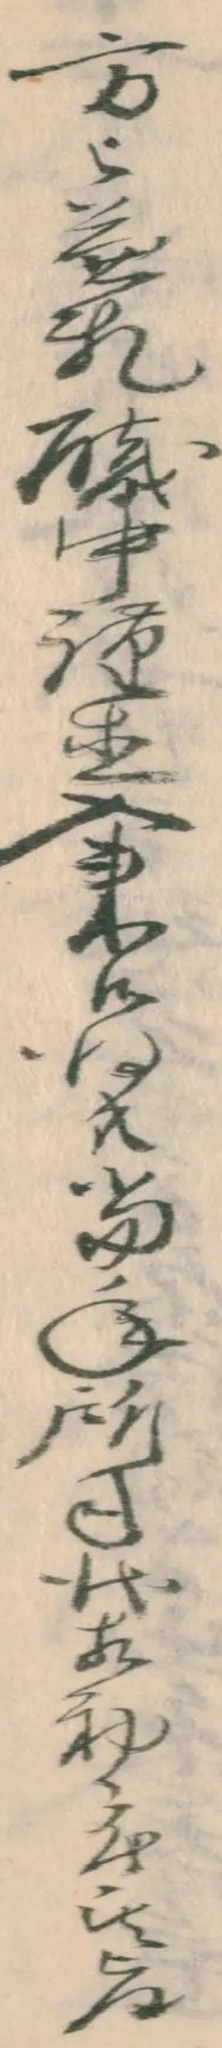方被兼頼職中謹直入来候得共當年所司代相勤に付其旨
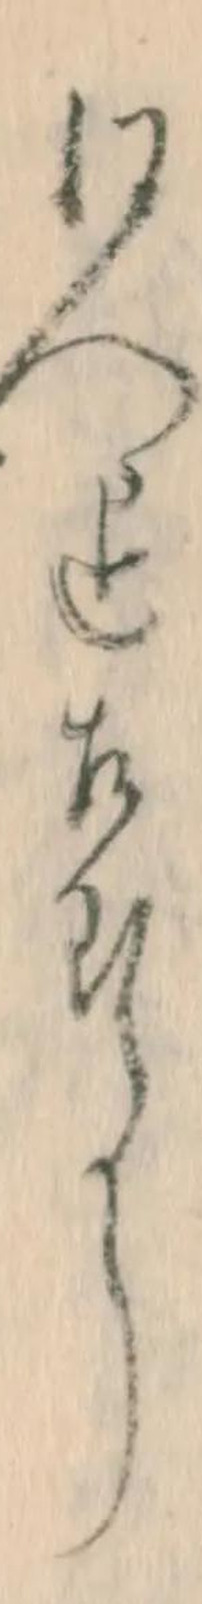同人迄相断了
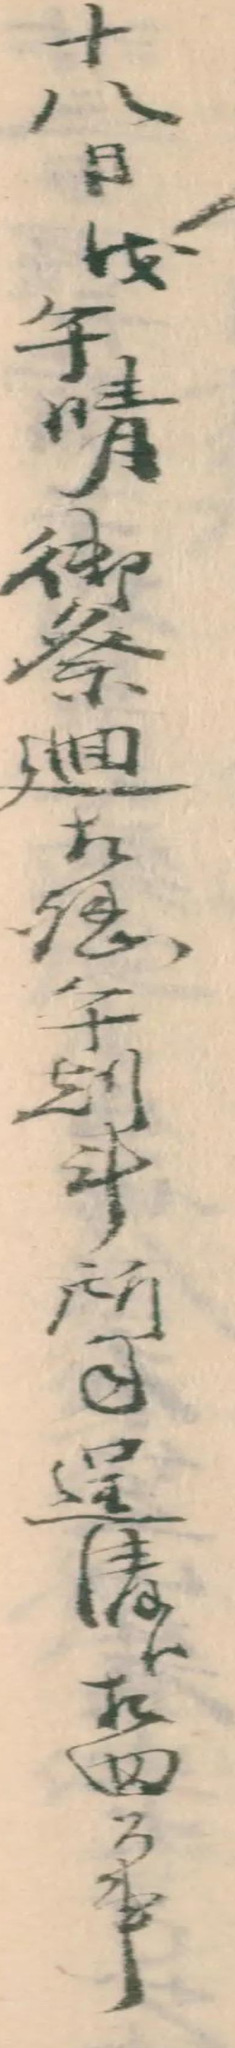十八日戊午晴御祭廻相認午刻斗所司逞清江相回候事
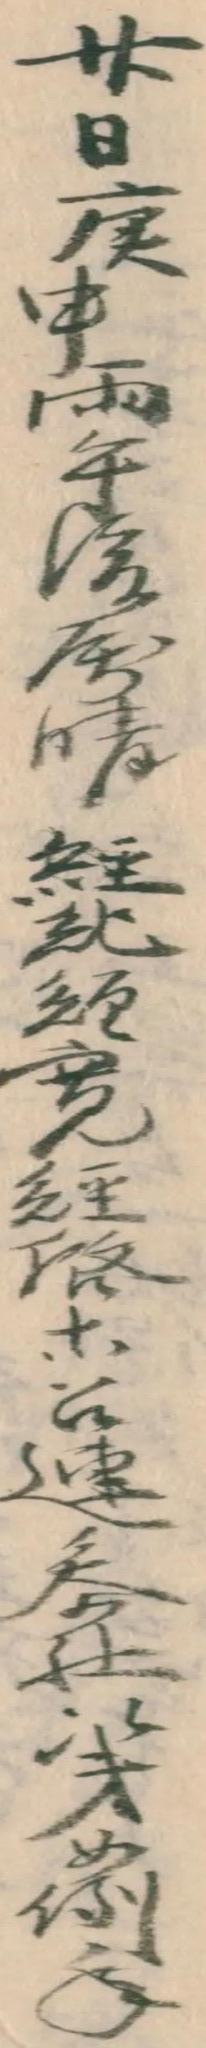廿日庚申雨午後属晴経紀経寛経啓等召連参社次第如例年
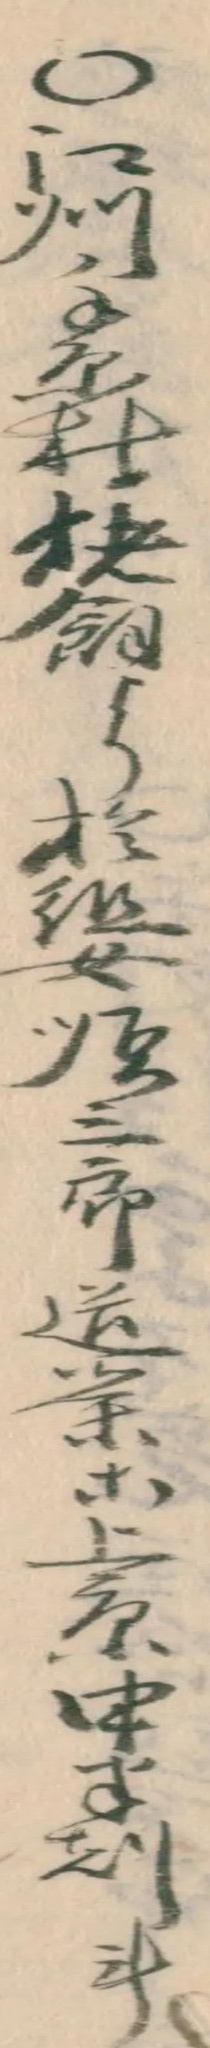○江州手原村猪飼より於組女順三郎道栄等上京申半刻斗
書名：賀茂社記録. 第66冊
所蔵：国立国会図書館 National Diet Library, JAPAN
